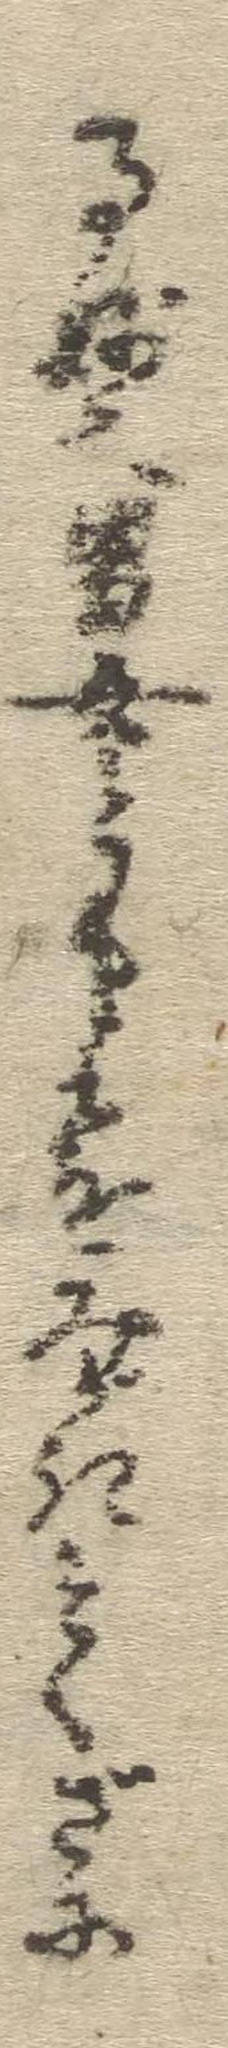事妙也男女ともはをみがきそくざに
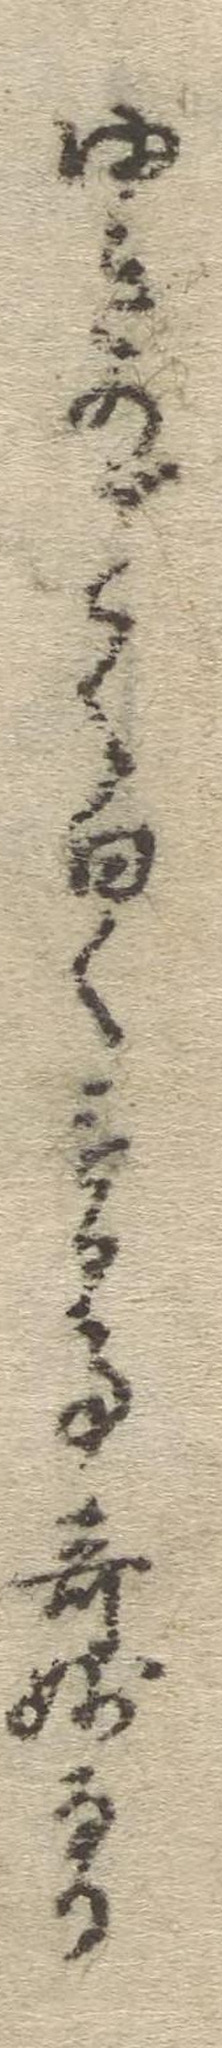ゆきのごとく白くする事奇妙なり
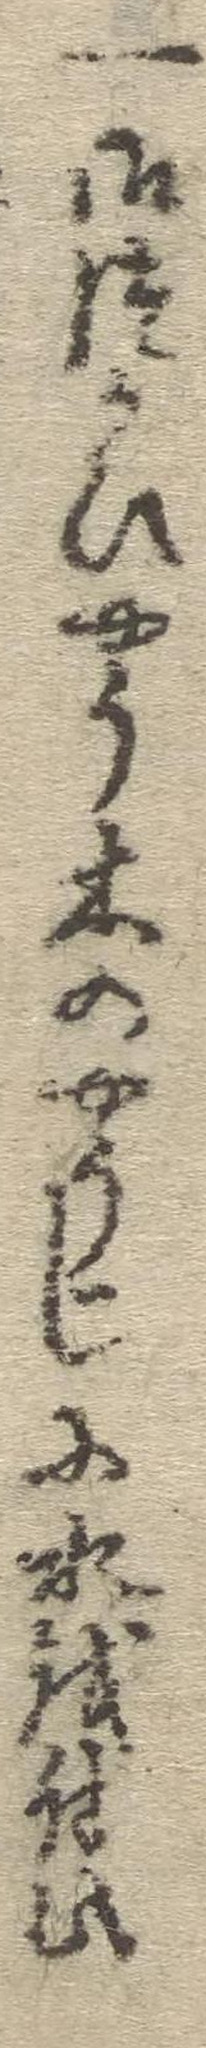一御つかひやう木のやうじに水を付此
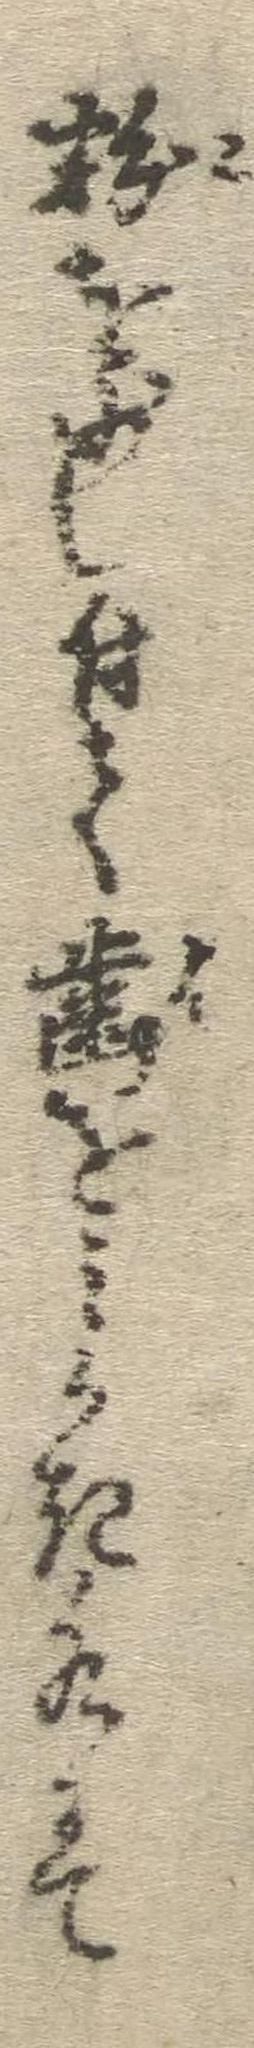粉を少し付て歯をみかき水にて
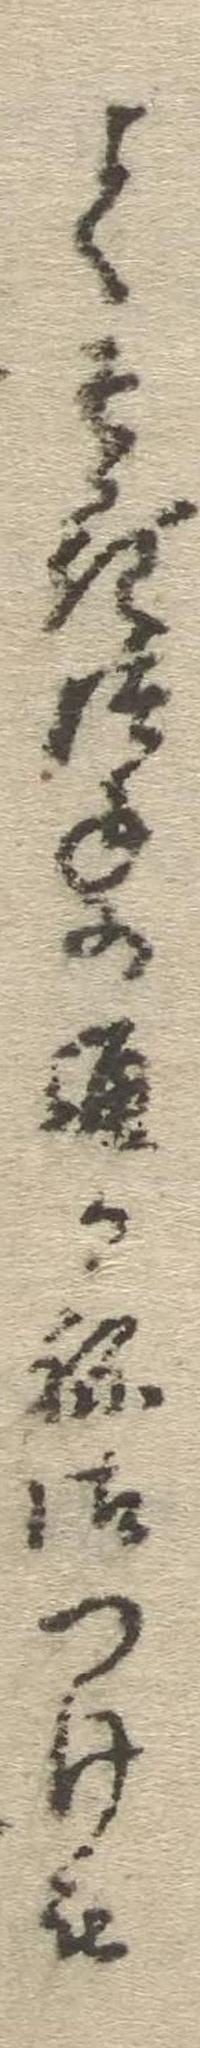よくすゝぎつねの通かね御つけ被
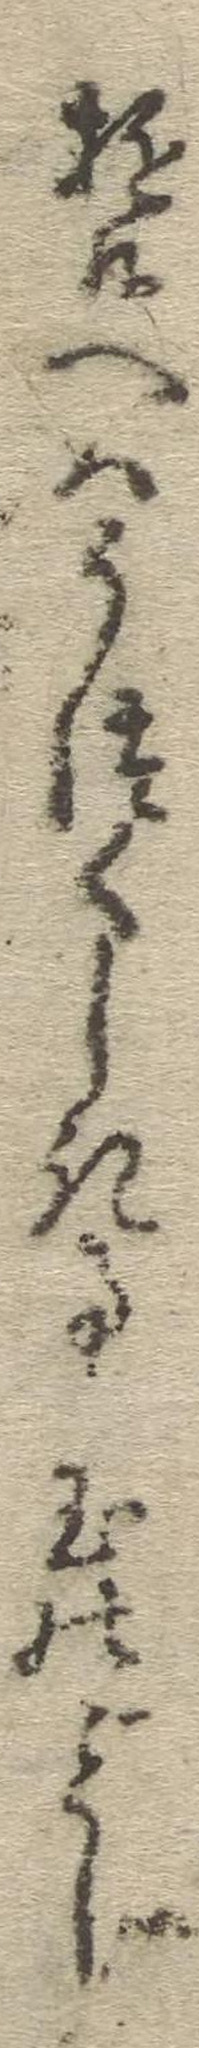遊候へはうつくしき事玉のごとし
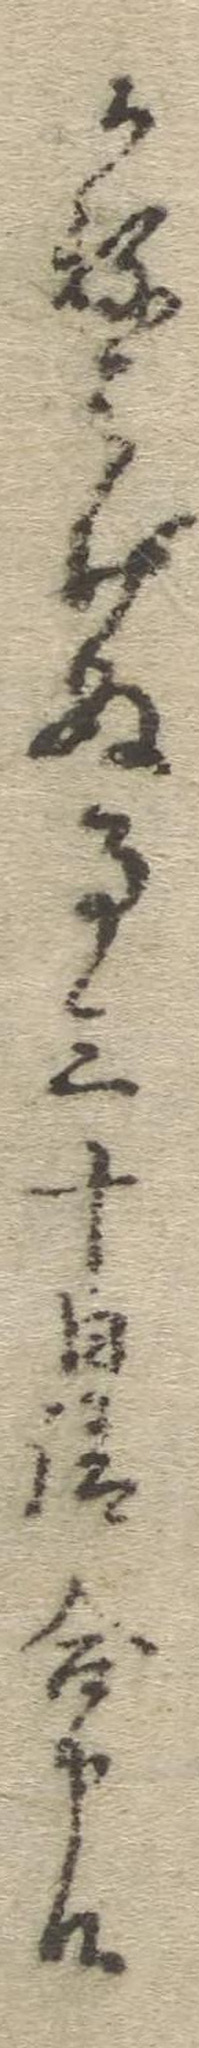かねはげぬ事三十日請合申候
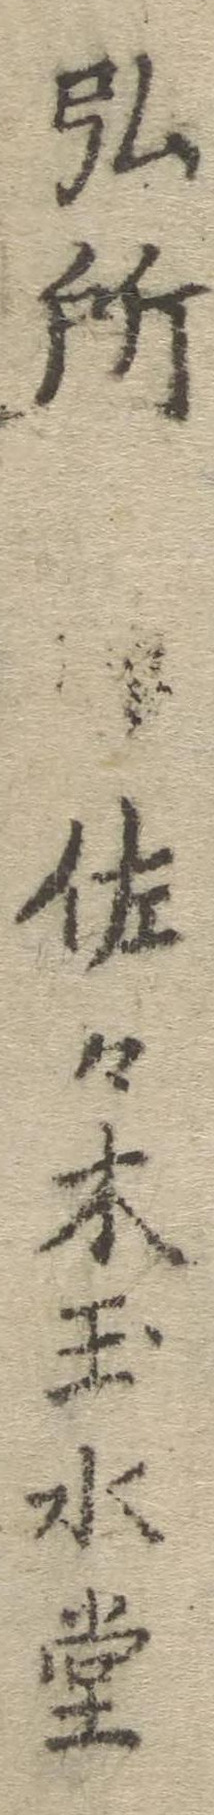弘所佐々木玉水堂

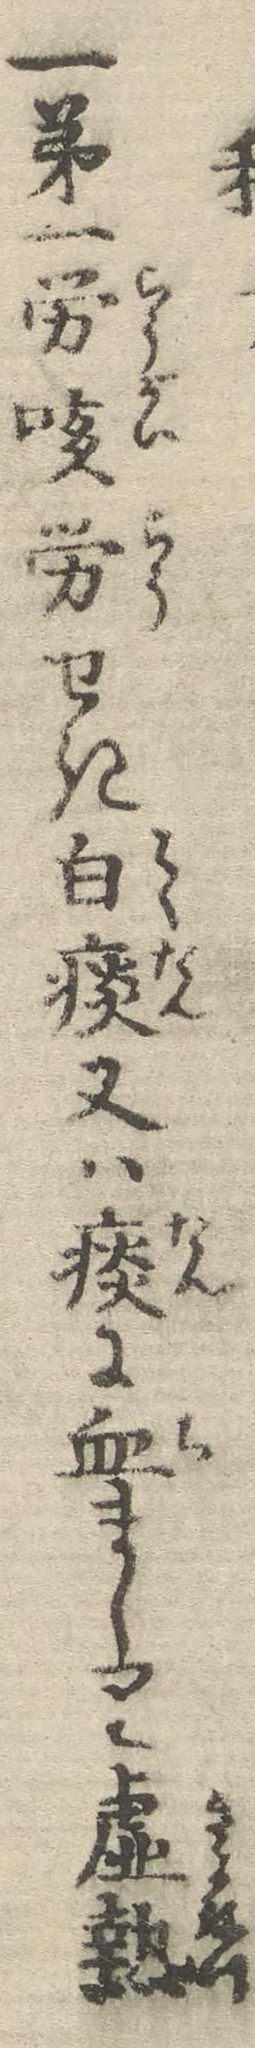一第一労咳労せき白痰又は痰に血ましり虚熱
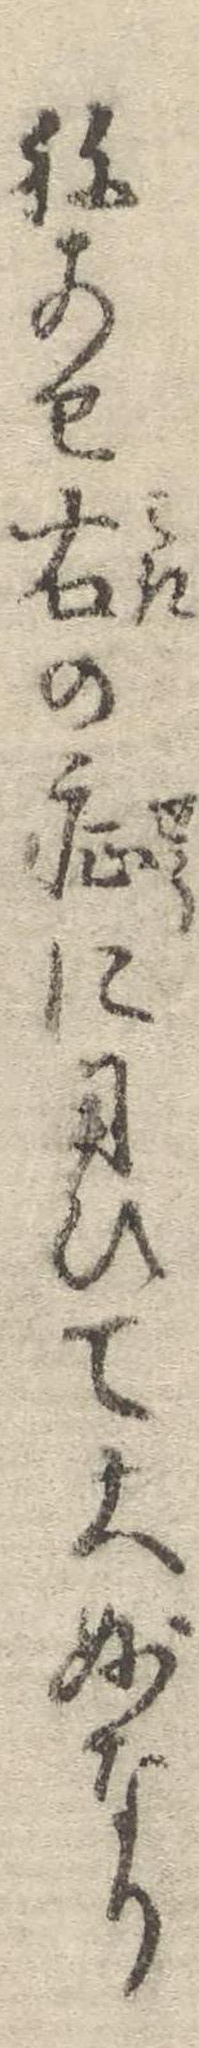ねあせ右の症に用ひて大妙なり
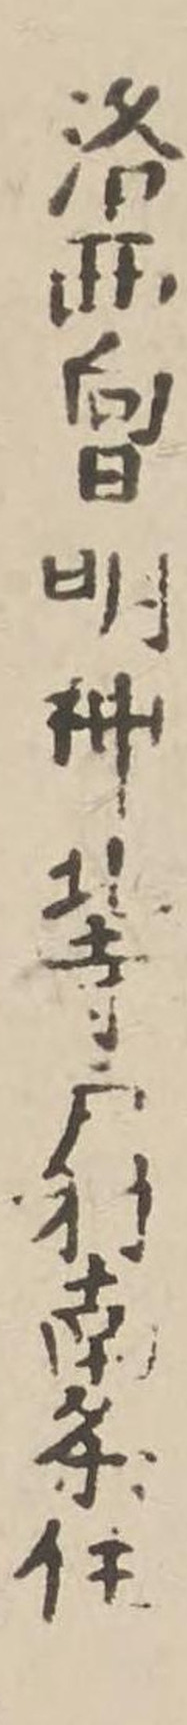洛西向日明神北寺戸村南条住
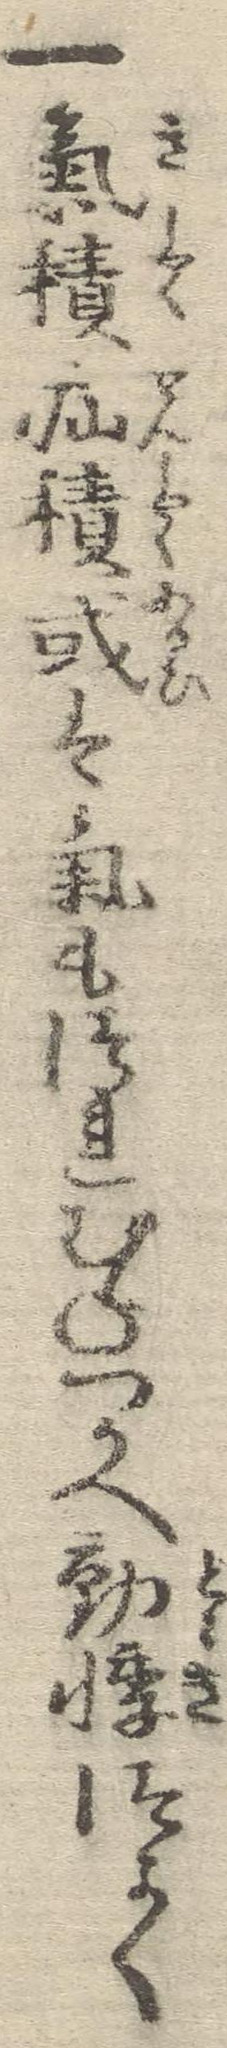一気積疝積或は気もつれむねつかへ動悸つよく
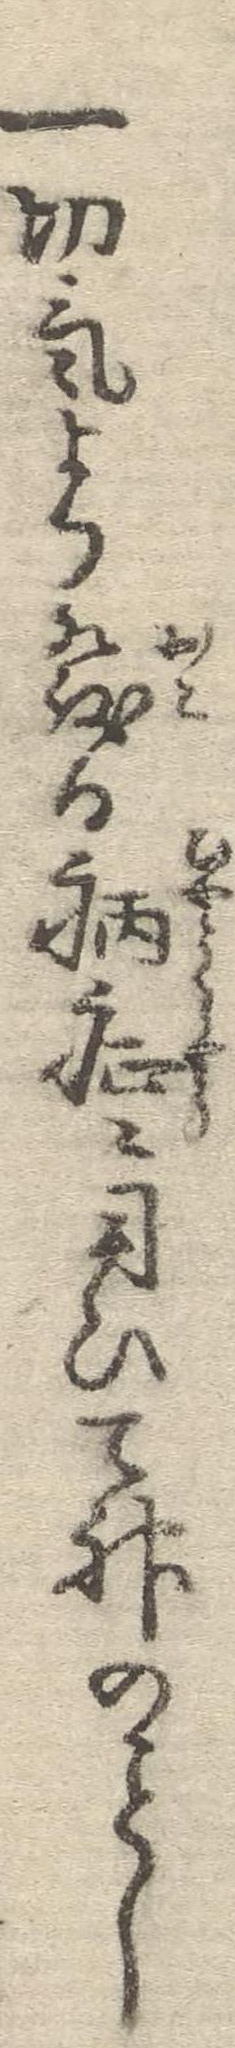一切気より発る病症に用ひて神のことし
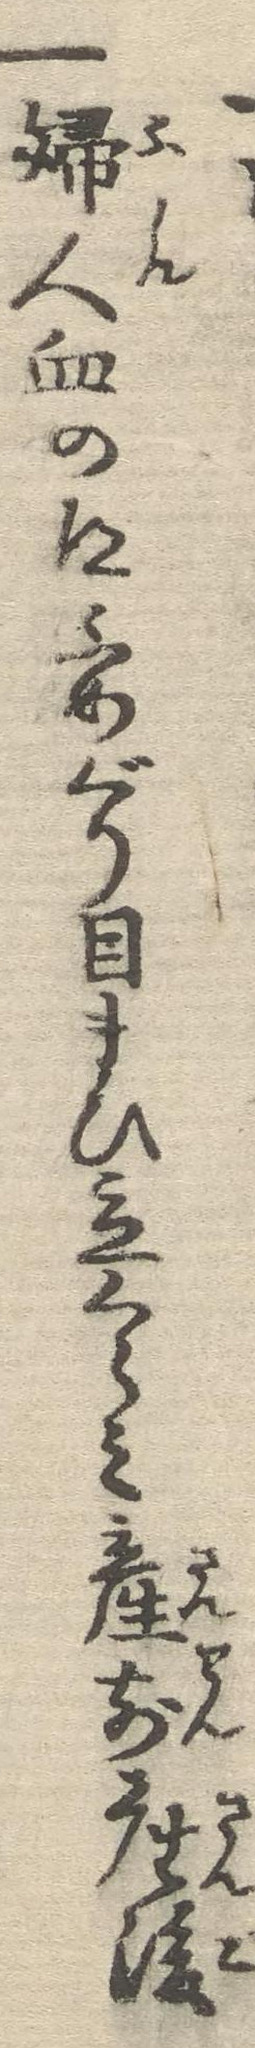一婦人血の道ふめぐり目まひ立くらみ産前産後
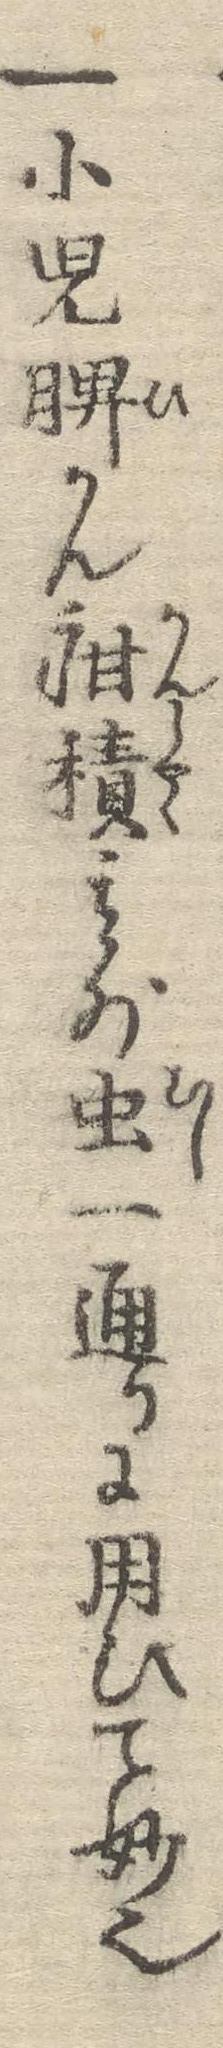一小児腗かん疳積其外虫一通りに用ひて妙也
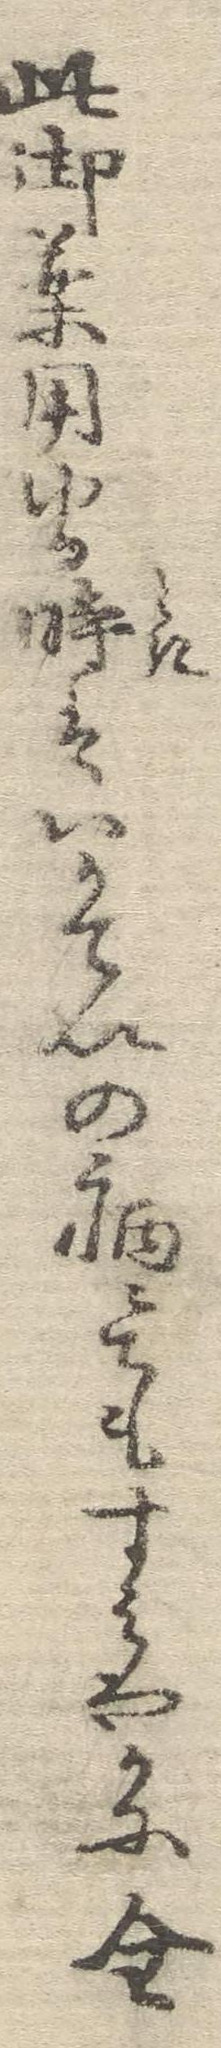此御薬用ゆる時はいかていの病にてもすみやかに全
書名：浪華薬種問屋能書張交帖. 二
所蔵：国立国会図書館 National Diet Library, JAPAN
